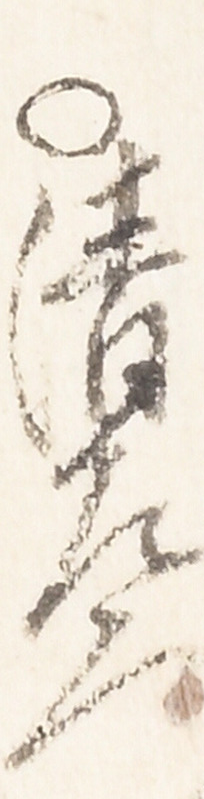〇長左衛門
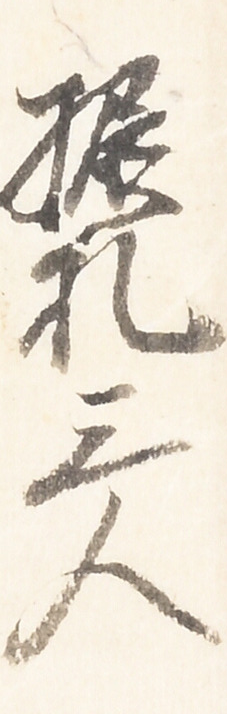振札三人
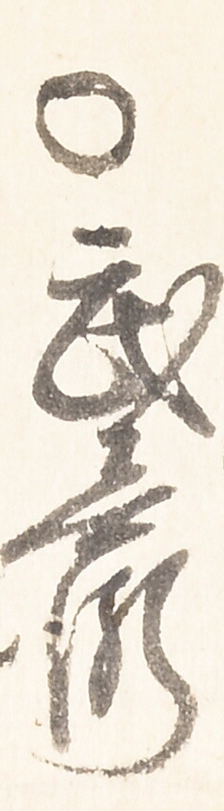〇武兵衛
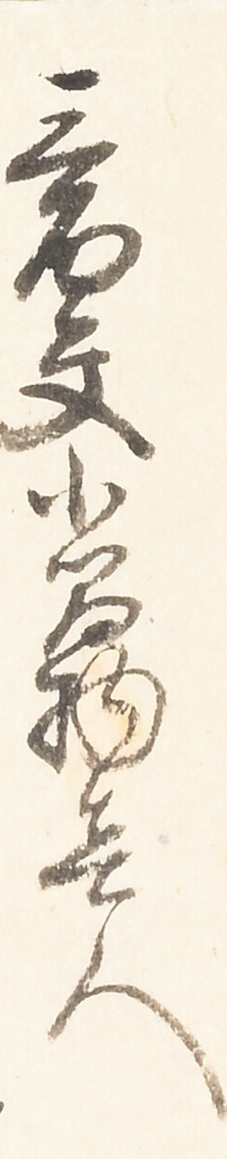三百文小間物壱人
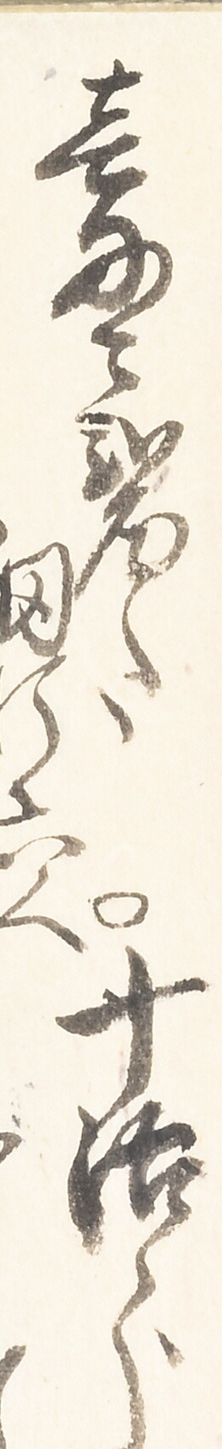壱貫弐百文〇十治郎
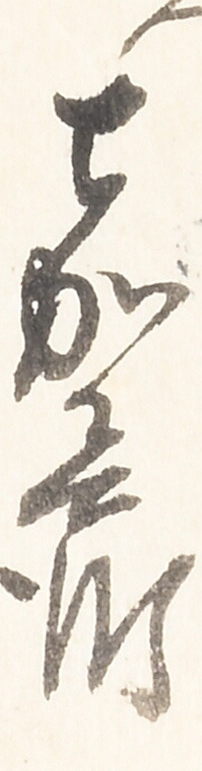常兵衛
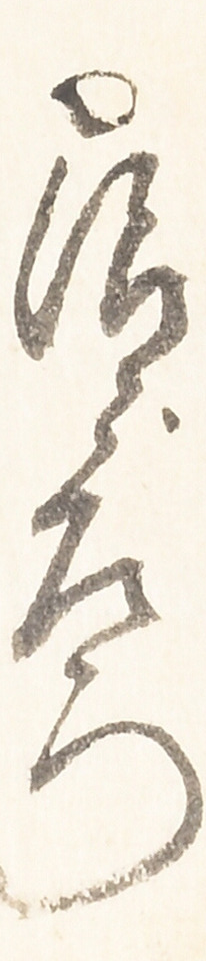〇治郎左衛門
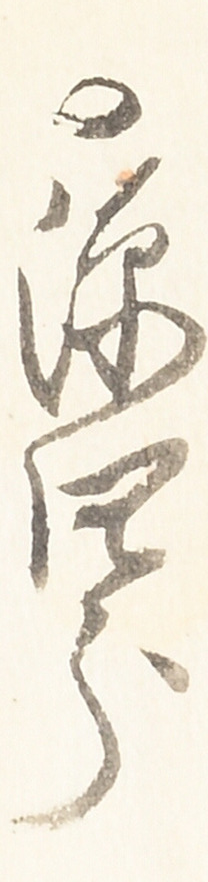〇源四郎

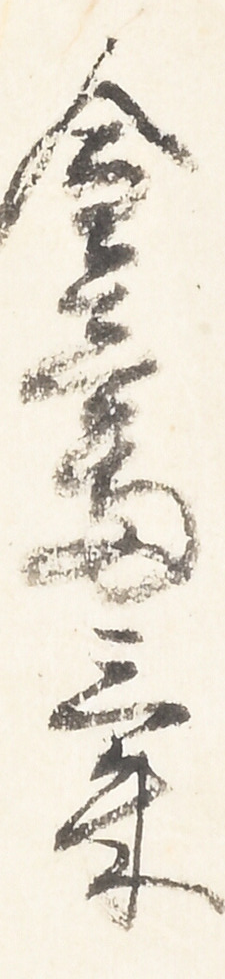金壱両三朱
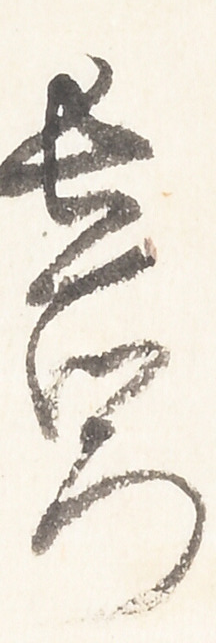長右衛門
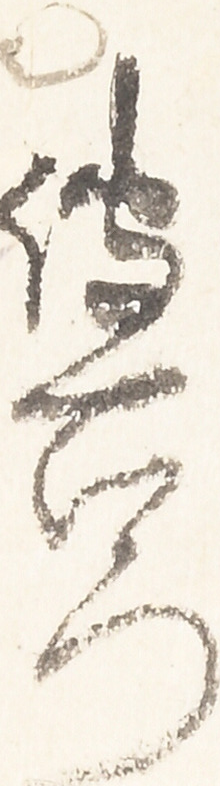長右衛門
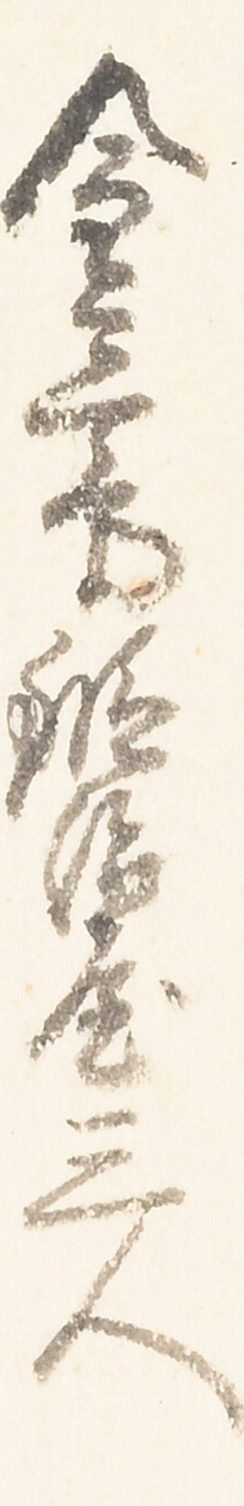金壱分鍛冶屋三人
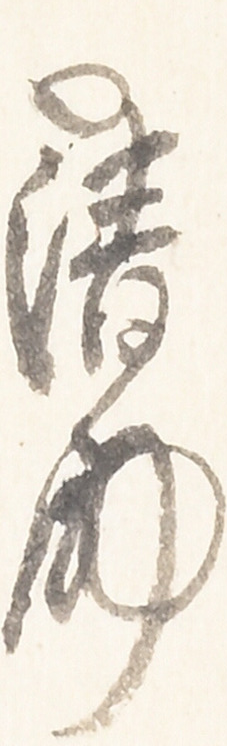〇清助
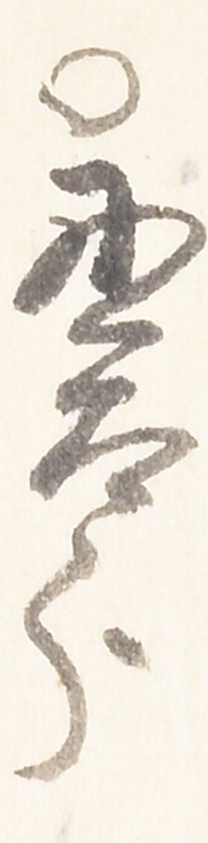〇丑太郎

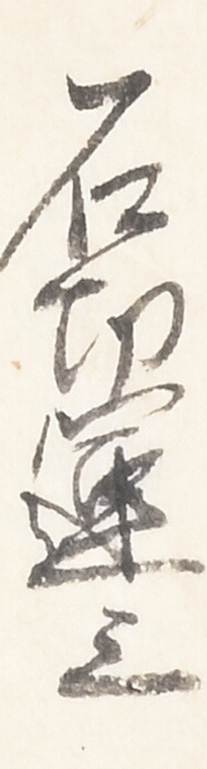石切運上
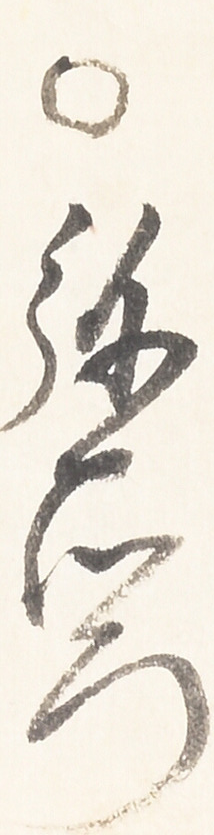〇弥右衛門
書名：（諸運上控帳）
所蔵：伊那市立高遠町図書館・合同会社AMANE
